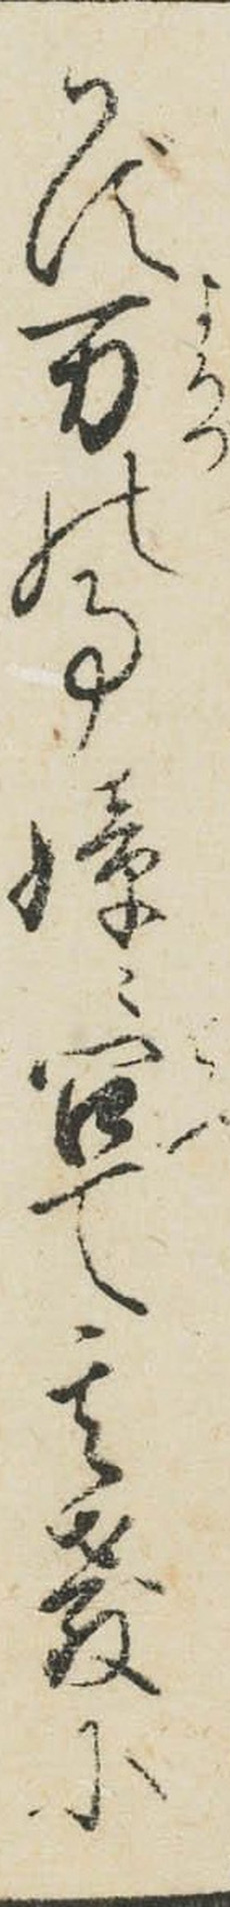らず万の事嫜問て其教に
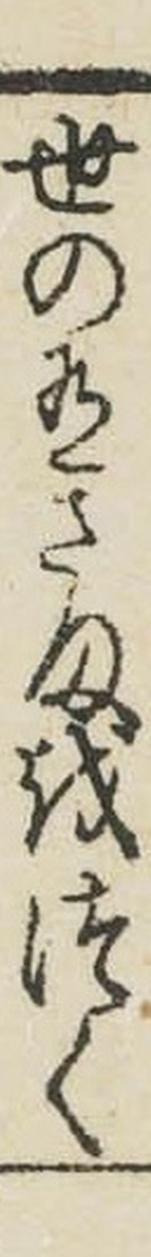世の有さまをつく
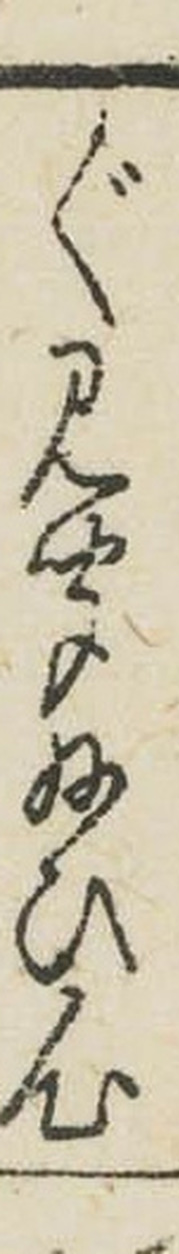〴〵見聞給ひ心
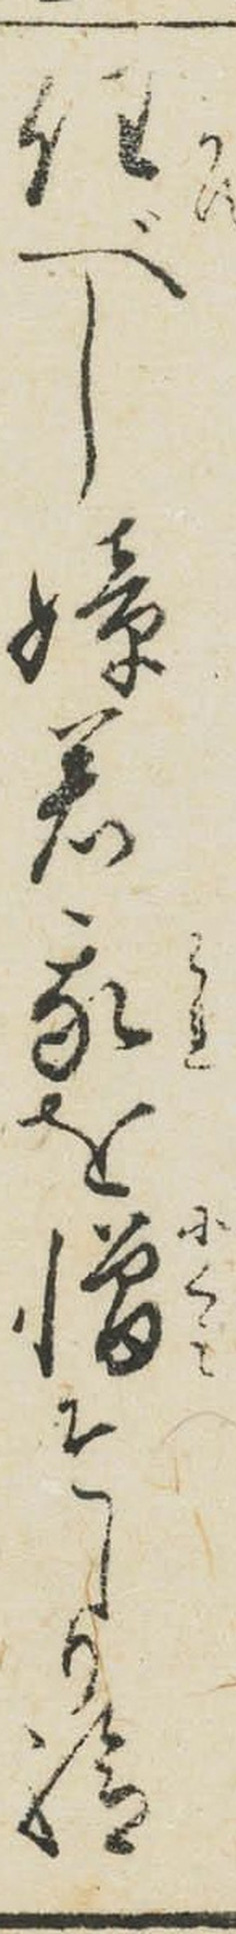任べし嫜若我を憎そしり給
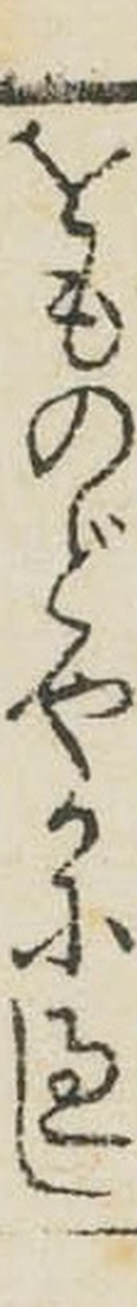をものどやかに過し
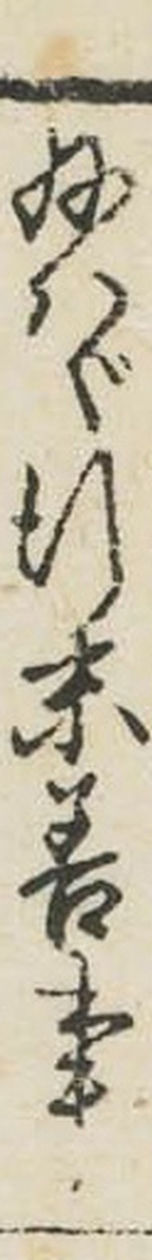給はゞ行末善事
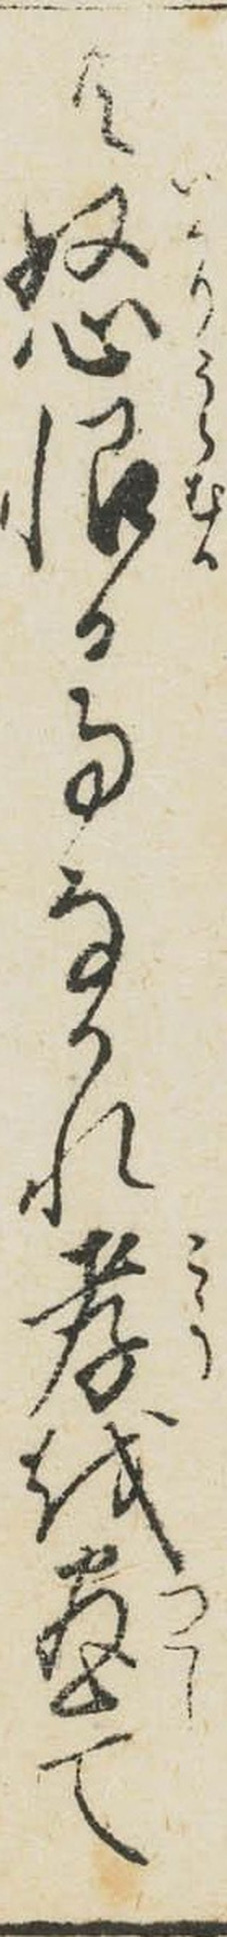共怒恨る事なかれ孝を尽て
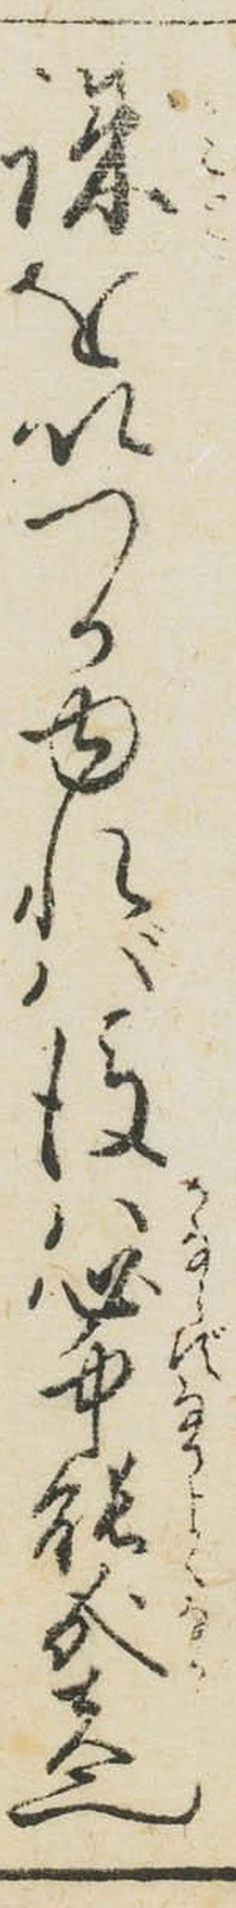誠を以つかゆれば後は必中能成者也
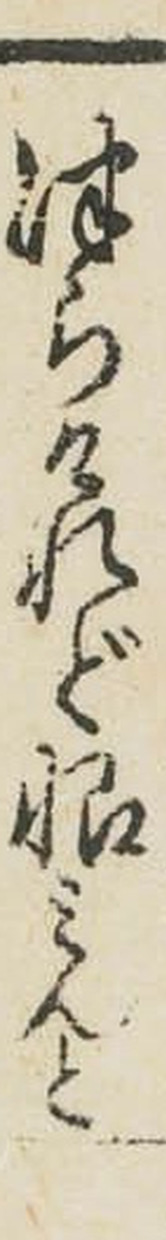つらけれど恨みんと
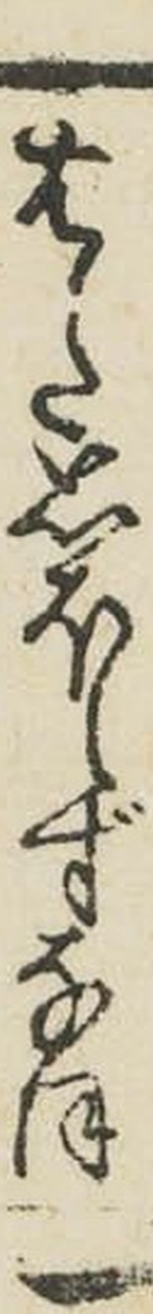はた思ほえずなほ
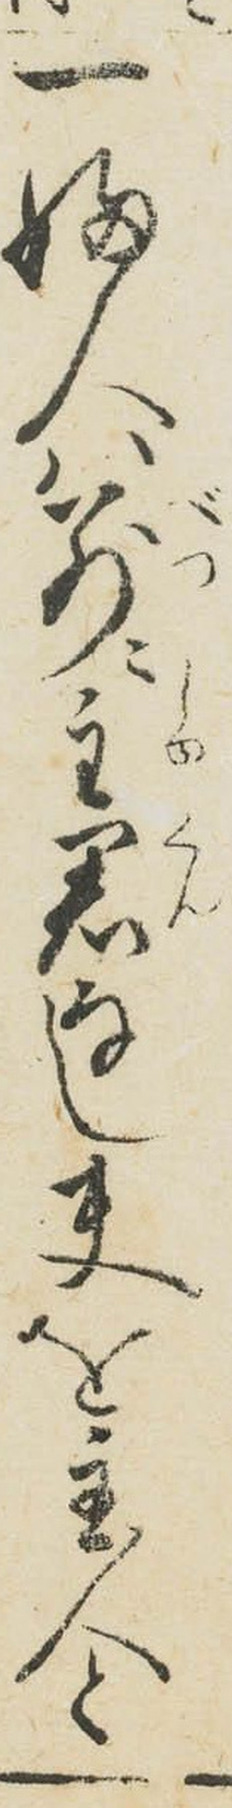一婦人は別主君なし夫を主人と
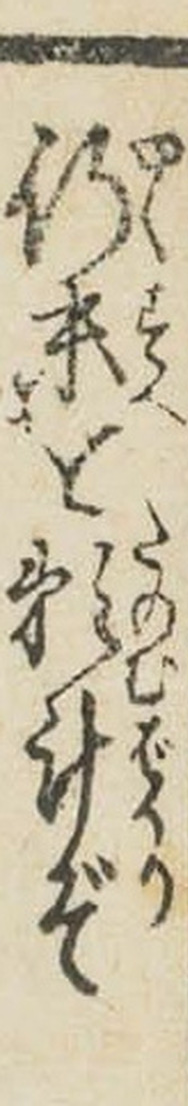行末を頼計ぞ
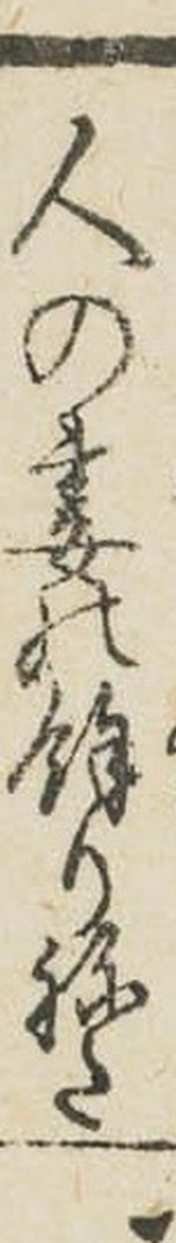人の妻の余りねた
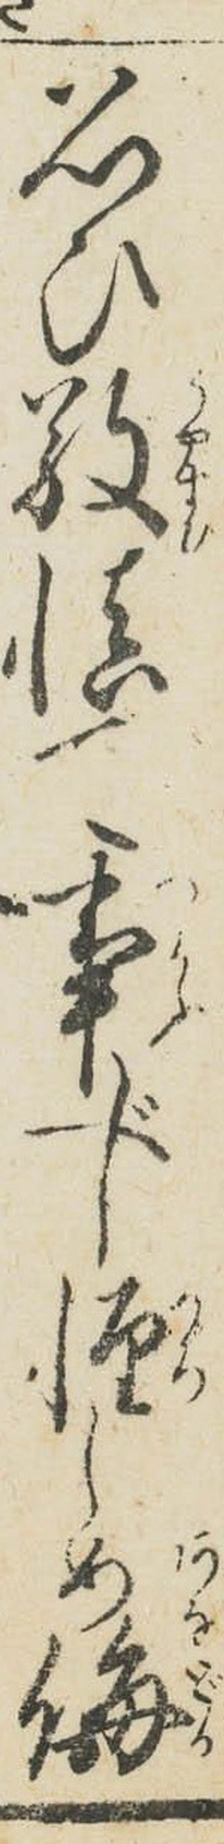思ひ敬慎て事べし軽しめ侮
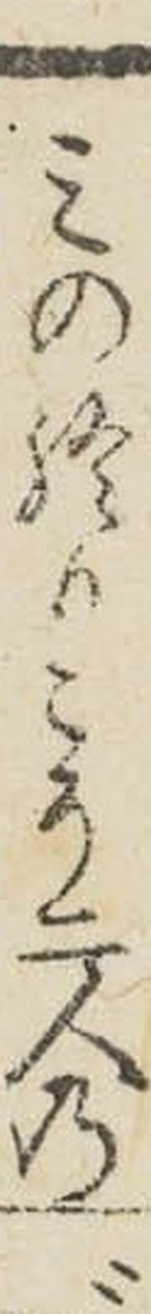みの終りこそ二人の
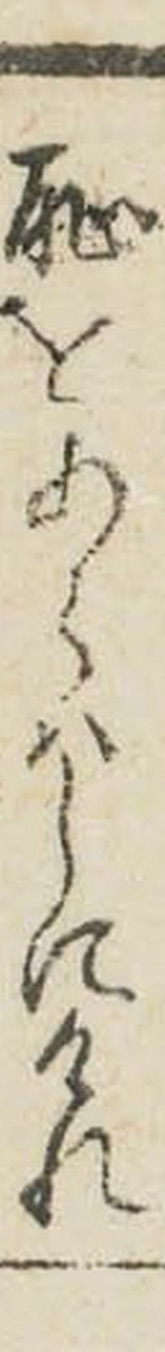恥をあらはしにけれ
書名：女大学
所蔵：東京学芸大学教育コンテンツアーカイブ
